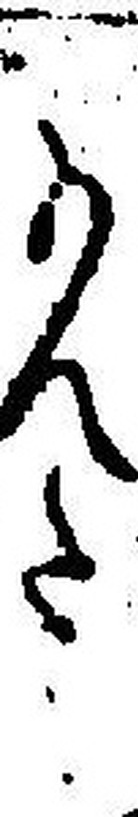もんた
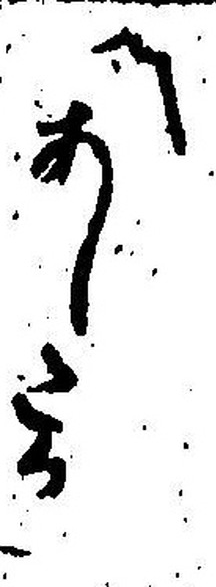〽あしたか
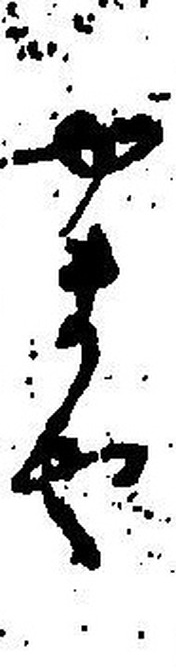やまや
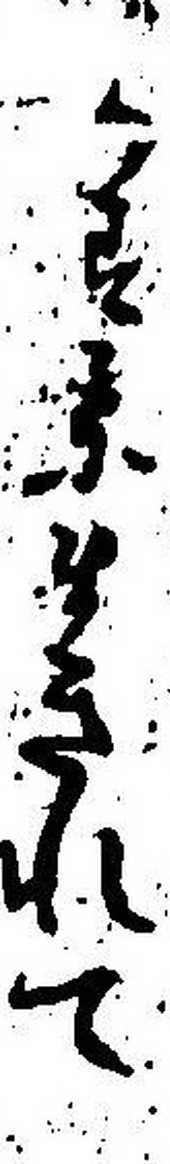かすみにまきれて
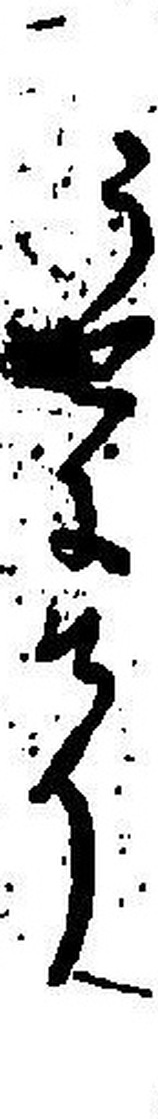うせにけり

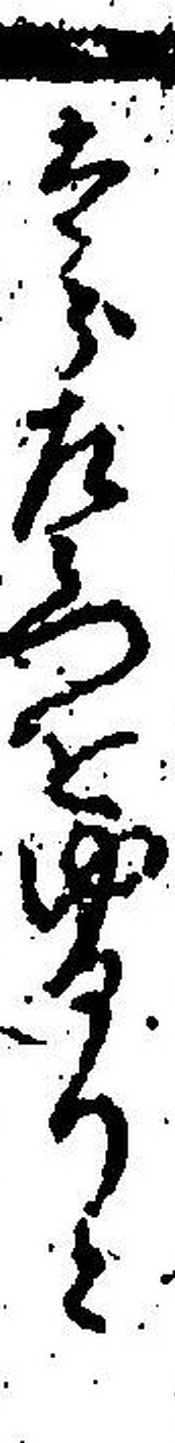太郎左衛門をゆるりと
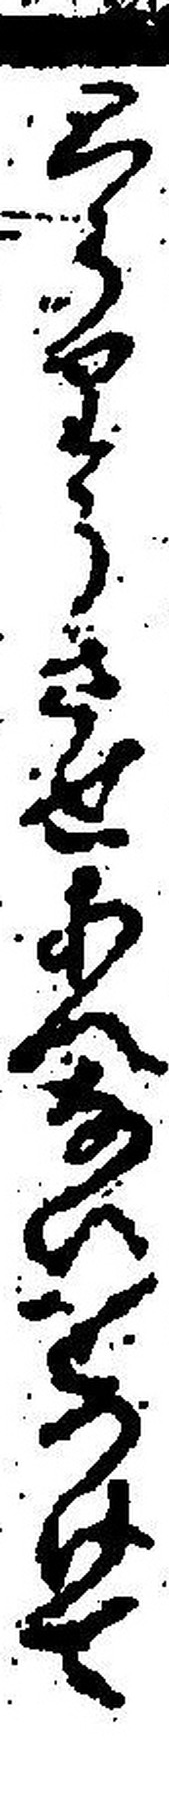とうりうさせあんないをつけて
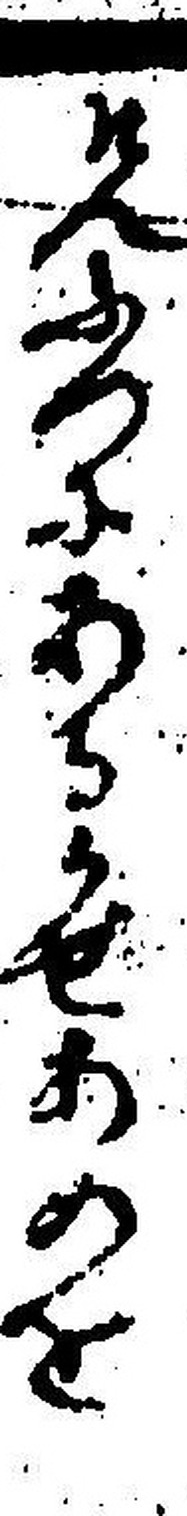けんふつにあるかせあめを
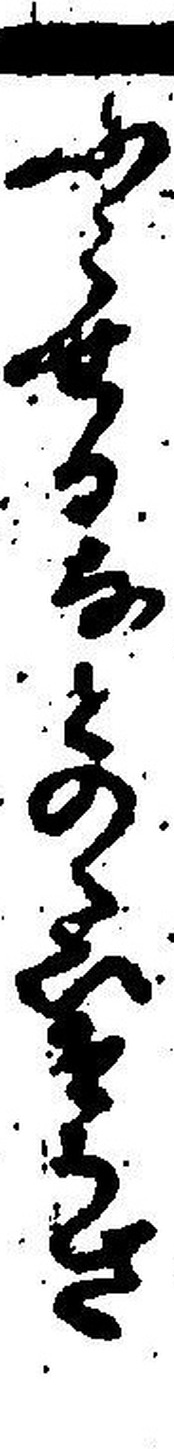ふらせるなとのたいそうさ
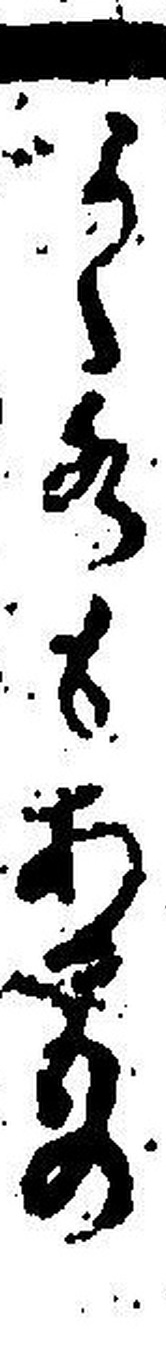よく水もあるもの
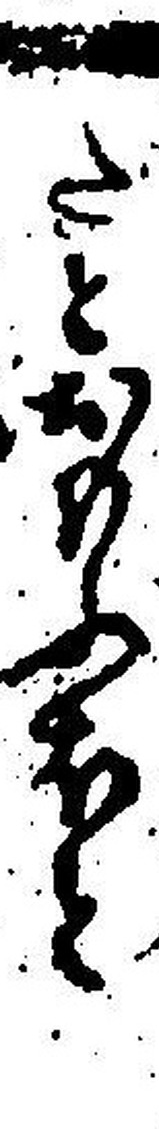だとおもふほと
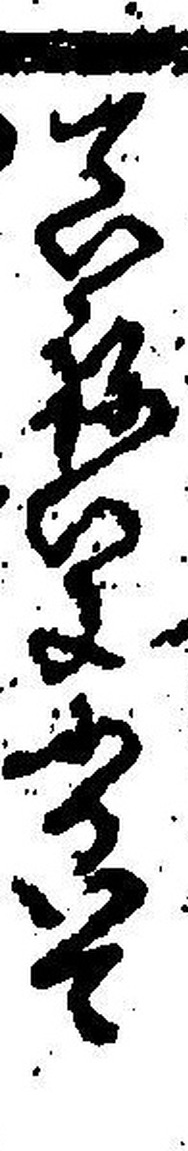ていねいにふるいて
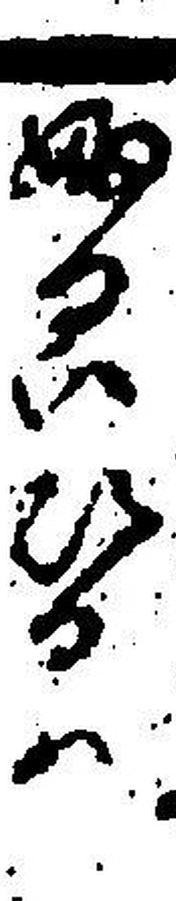ふるいひるは
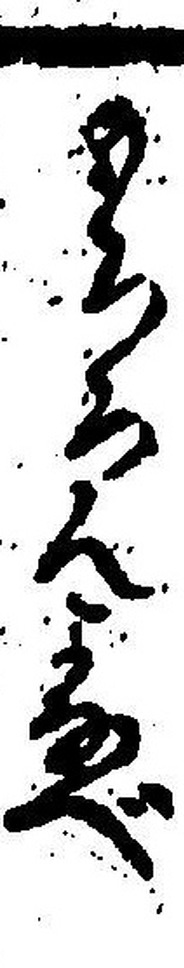もちろんよなべ
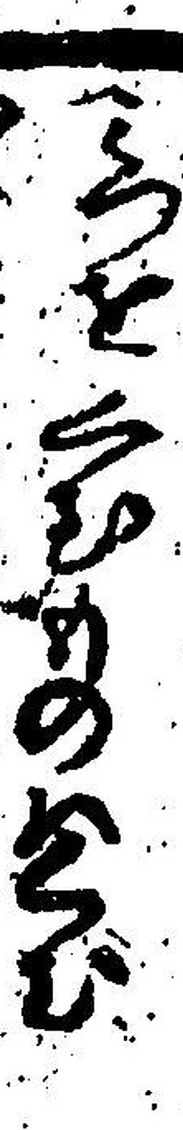みづをくむものはくむ
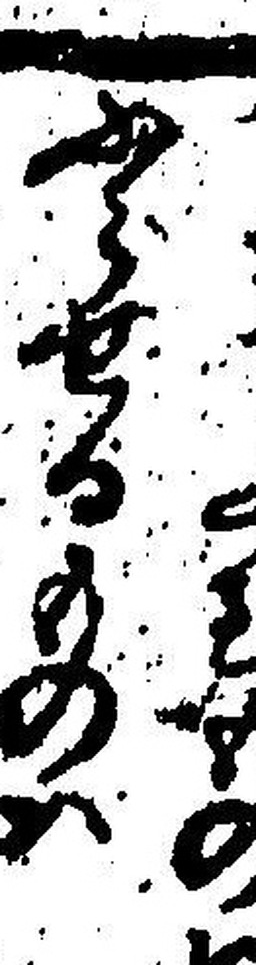ふらせるものは
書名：牡丹餅棚有 / 市場通笑作
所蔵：東京大学総合図書館 General Library in the University of Tokyo, JAPAN
